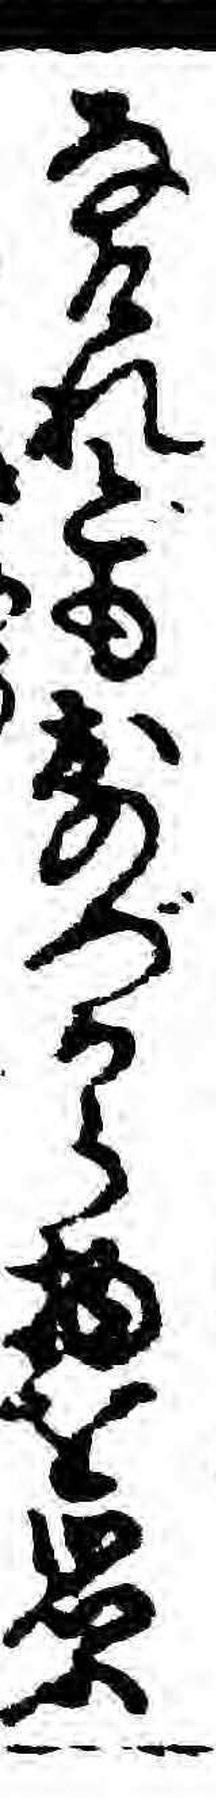なけれどもおのづから物を思ふ
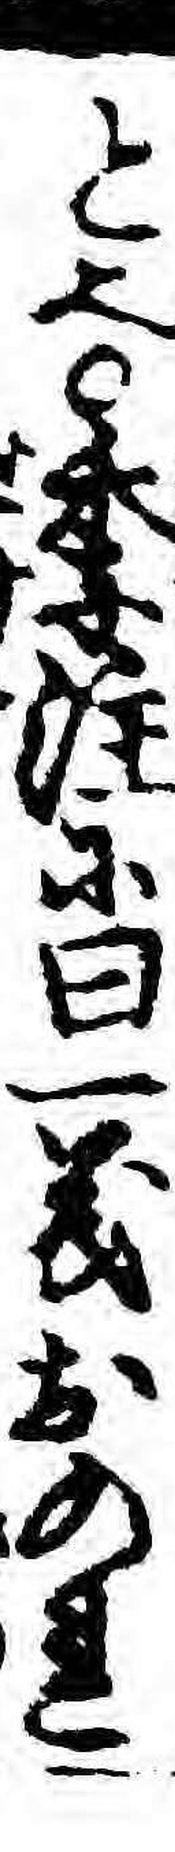と也〇季注に曰一義おのれ
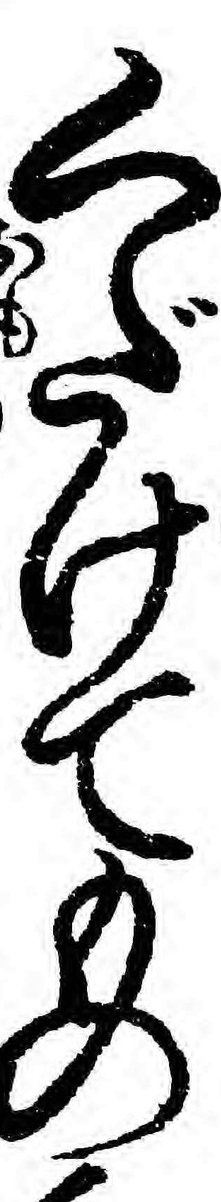くだけてものを
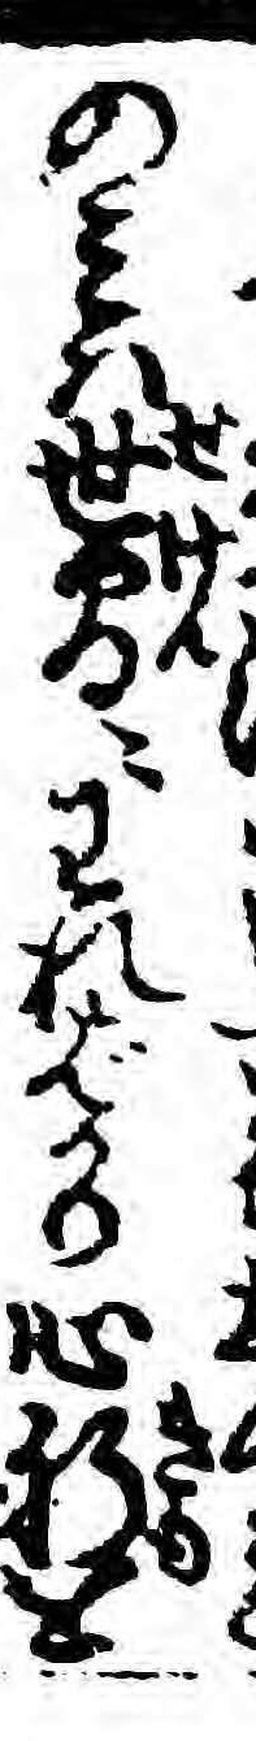のみは世間にわれはかり心肝を
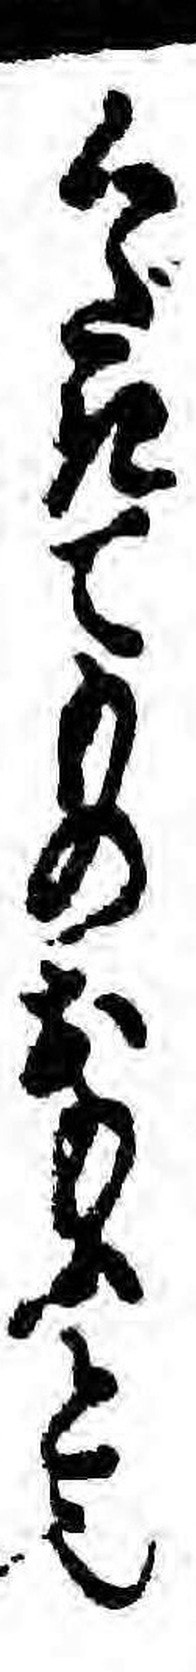くだきてものおもふと也
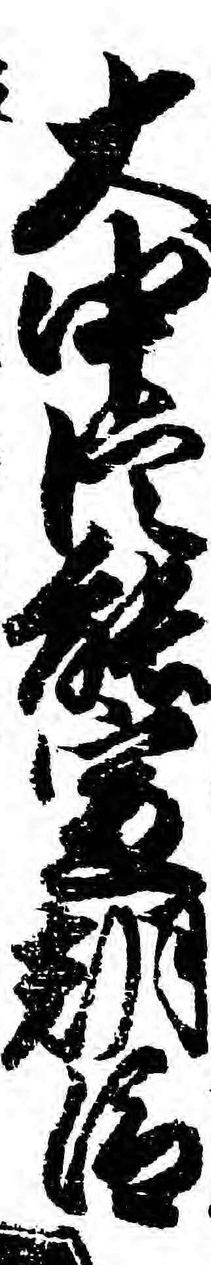大中臣能宣朝臣
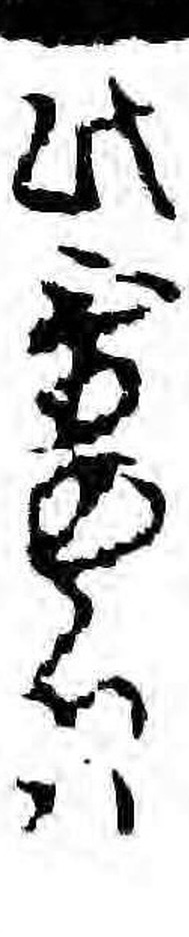此哥の心は
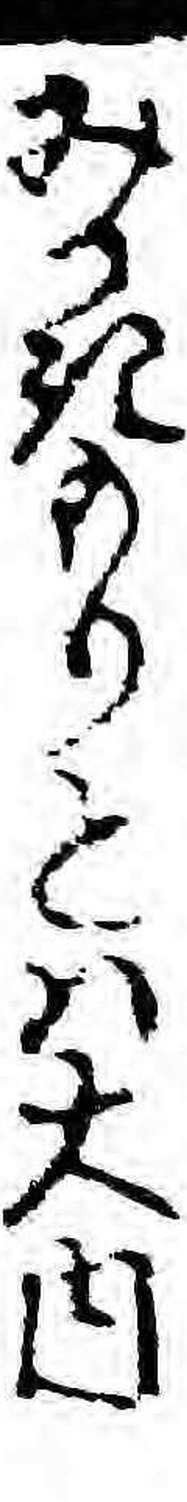みかきもりとは大内
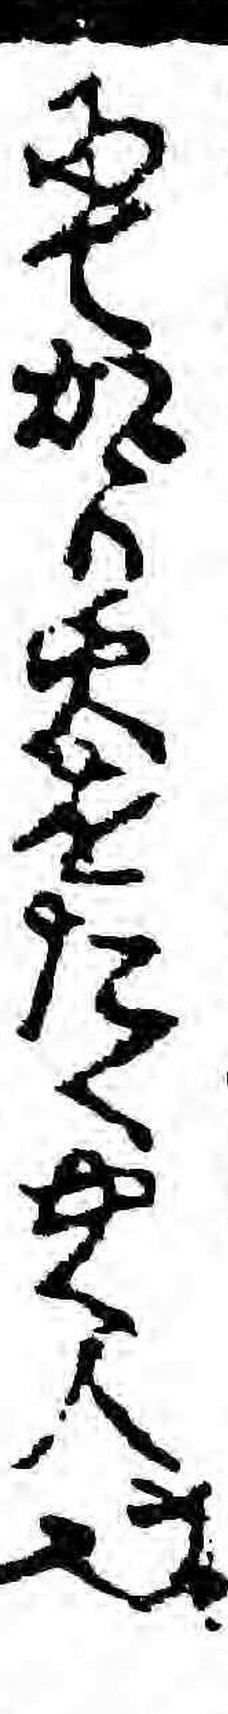にてかゞり火をたくやく人也
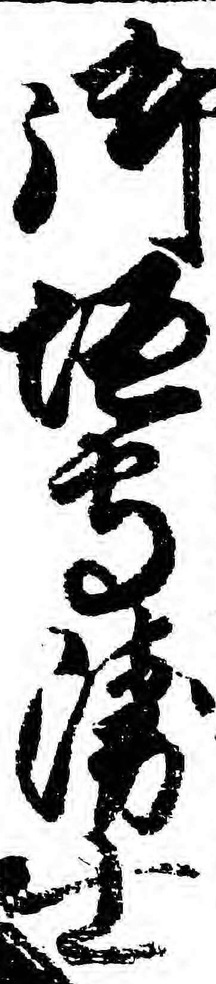御垣守衛士
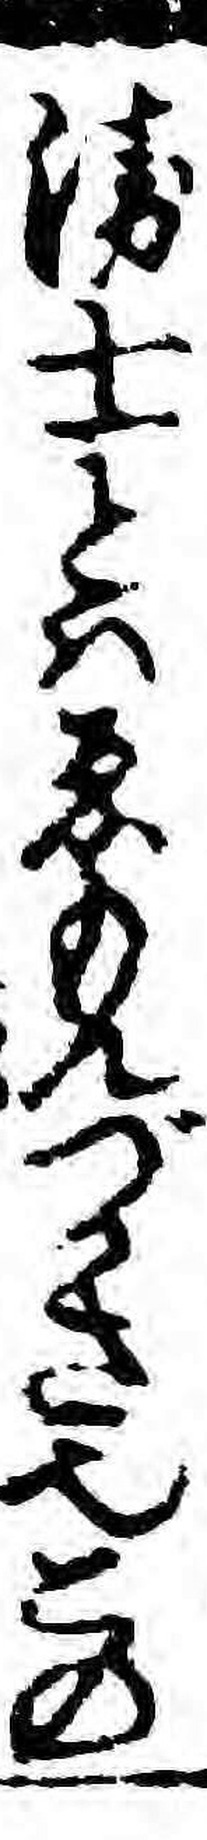衛士とはゑもんづかさ也この
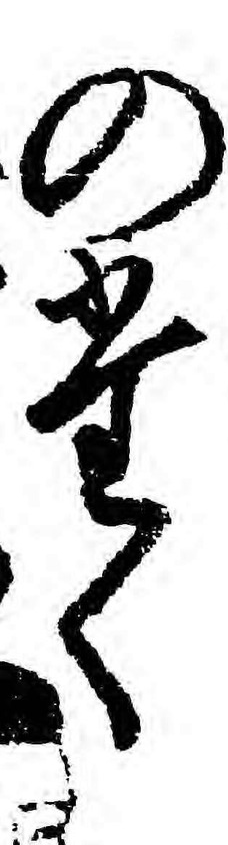のたく
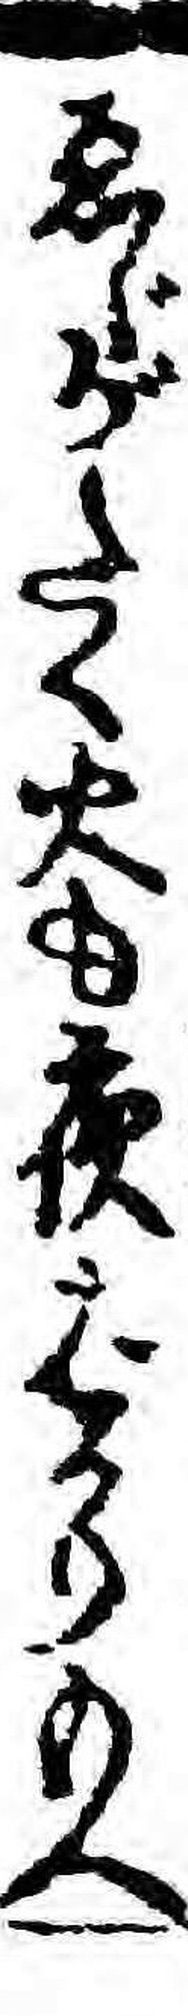ゑじがたく火も夜ばかりもへ
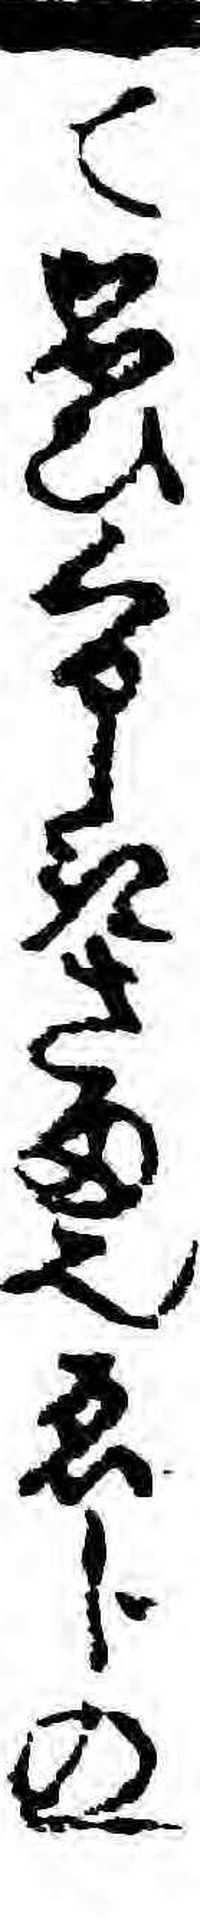て思ひくるしきさま也ゑじの
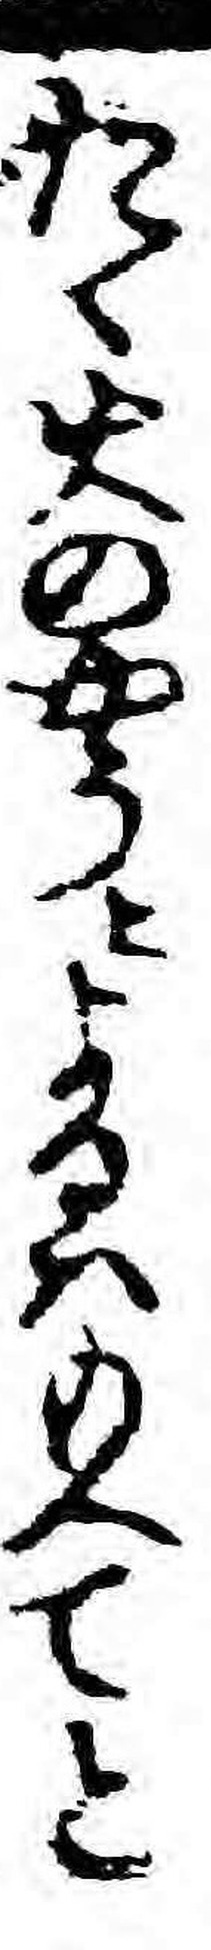たく火のやうによるはもへてと
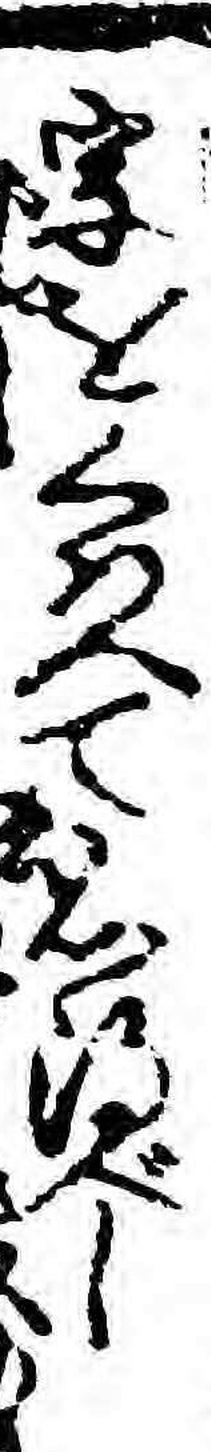字をくはへて心得べし
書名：頭書和歌注譯／壽賀多百人一首小倉錦
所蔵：国文学研究資料館
